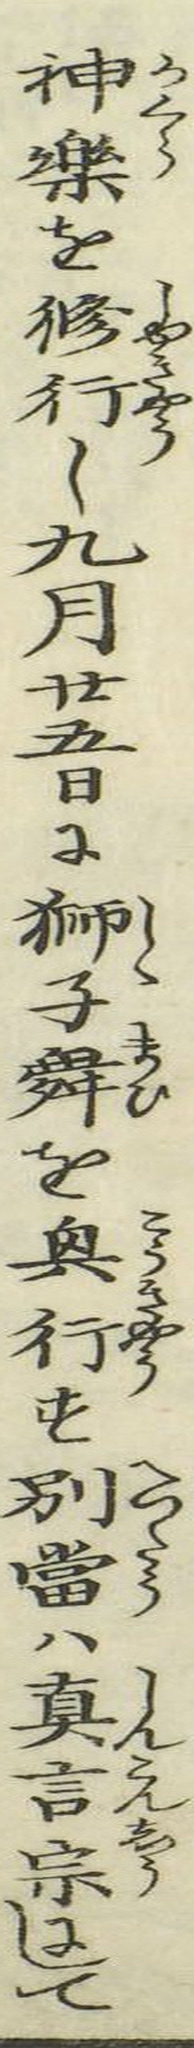神楽を修行し九月廿五日に獅子舞を興行す別当は真言宗にして
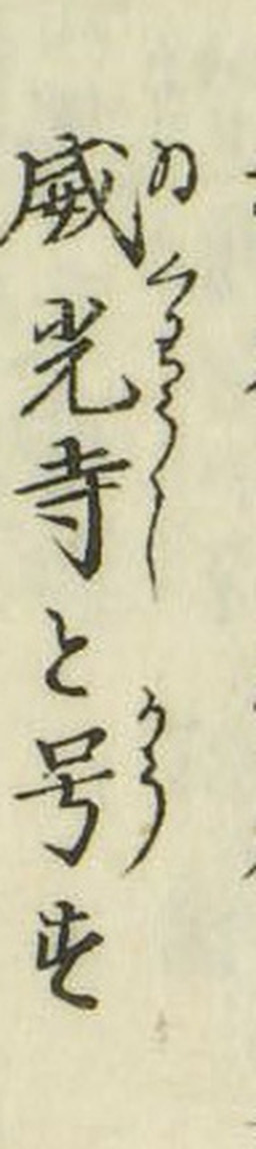居光寺と号す
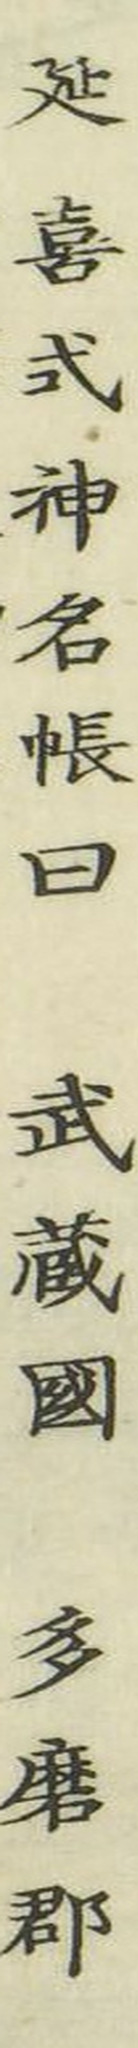延喜式神名帳曰武蔵国多磨郡
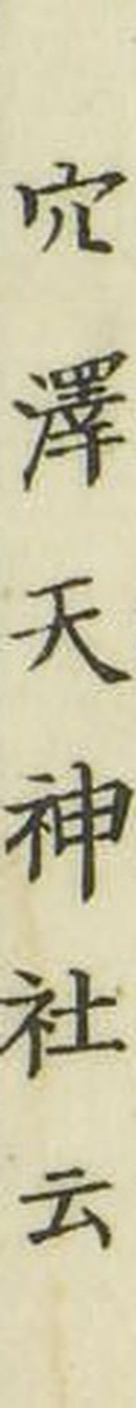穴沢天神社云

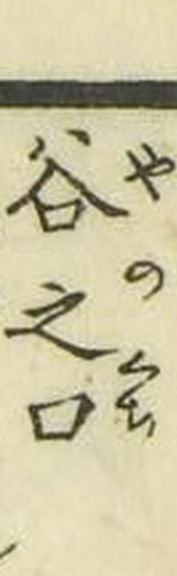谷之口
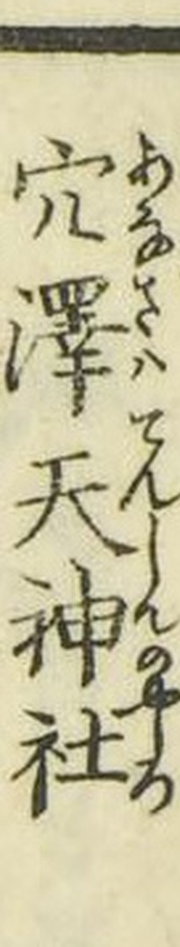穴沢天神社
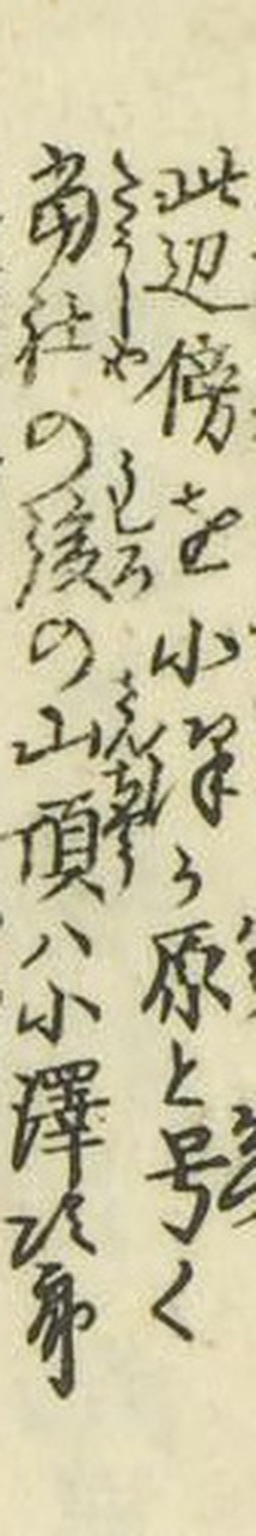当社の後の山頂は小沢次郎
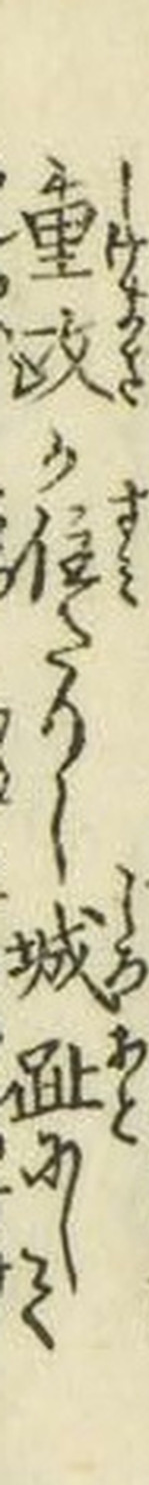重政か住たりし城趾にして
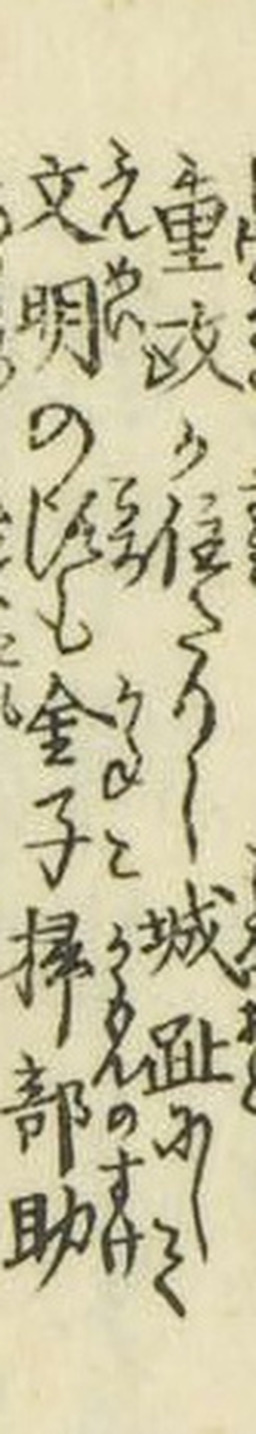文明の頃も金子掃部助
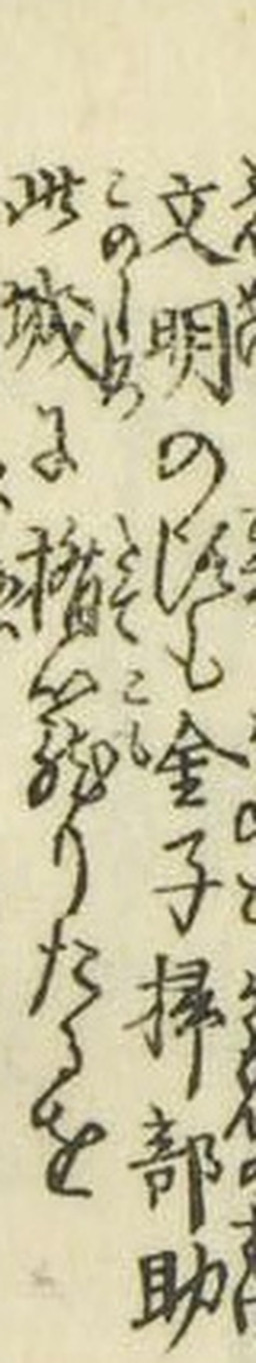此城に楯籠りたるを
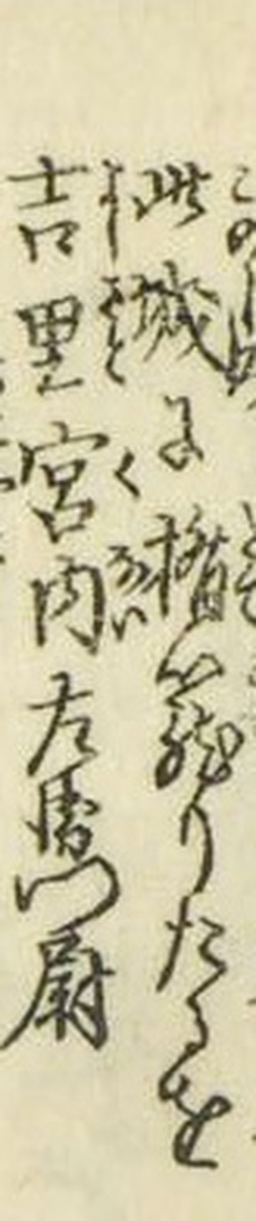吉里宮内左衛門尉
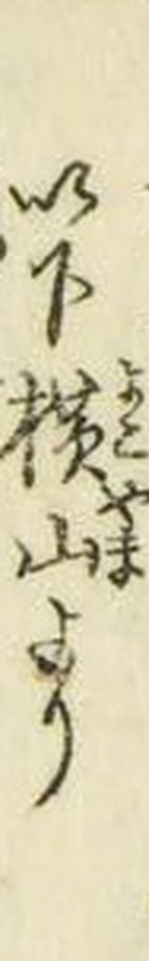以下横山より
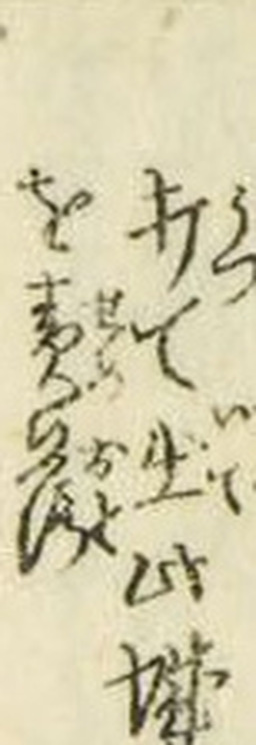を責落
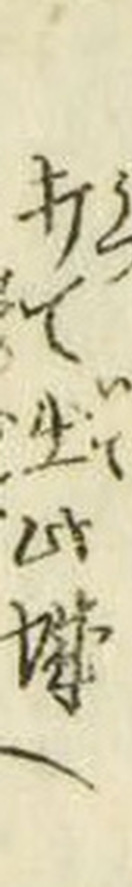打て出此城
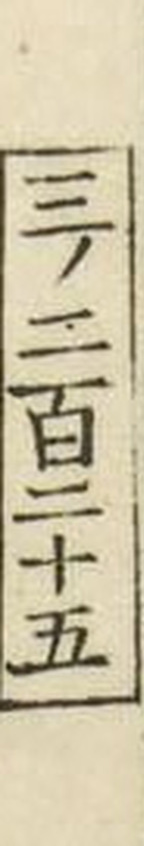三ノ二百二十五

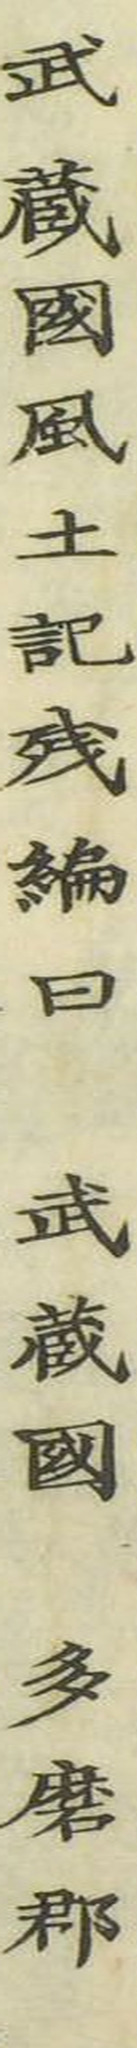武蔵国風土記残編曰武蔵国多磨郡
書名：江戸名所図会 20巻 巻之10
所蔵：東京学芸大学教育コンテンツアーカイブ
